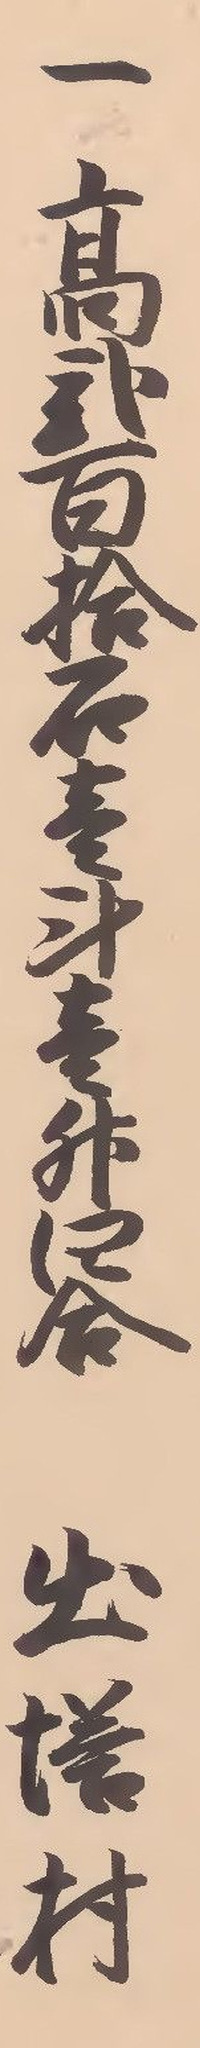一高弐百拾石壱斗壱升四合出塔村
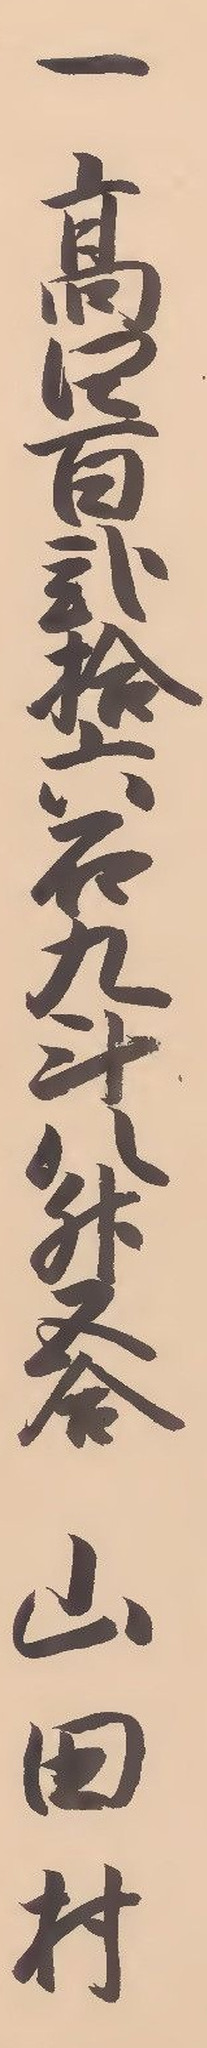一高四百弐拾六石九斗八升五合山田村

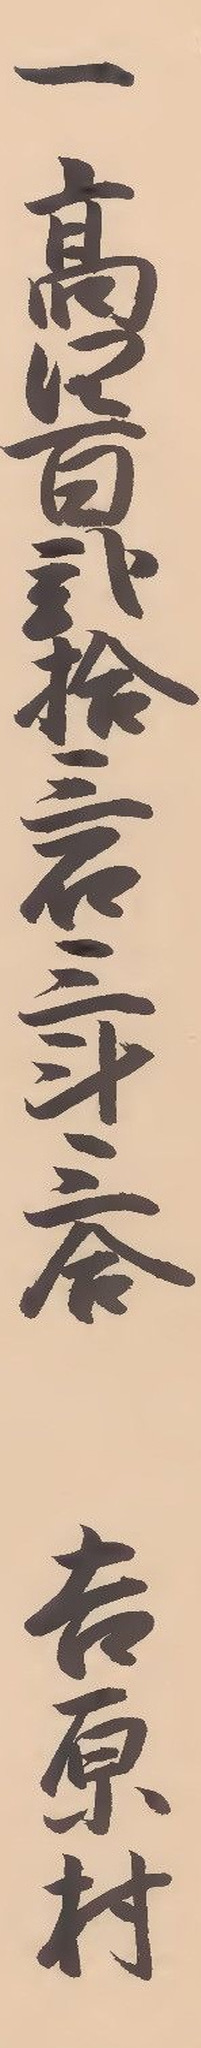一高四百弐拾三石三斗三合吉原村
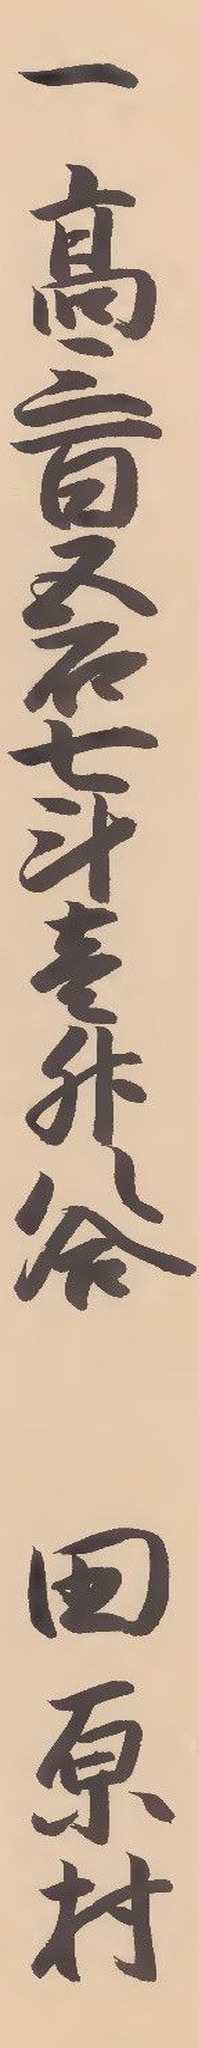一高三百五石七斗壱升八合田原村
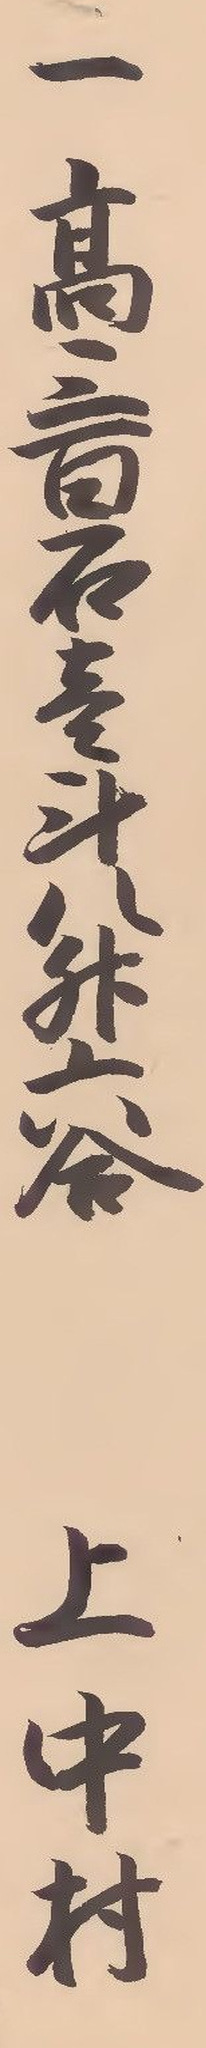一高三百石壱斗八升六合上中村
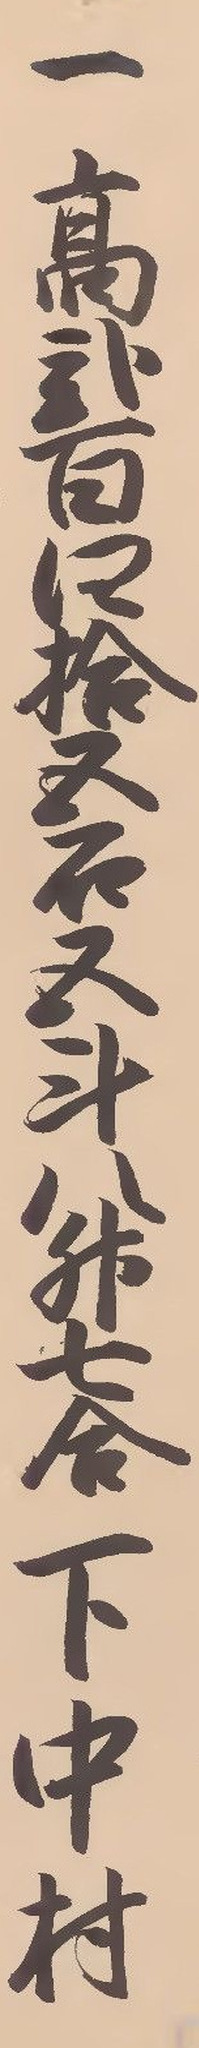一高弐百四拾五石五斗八升七合下中村
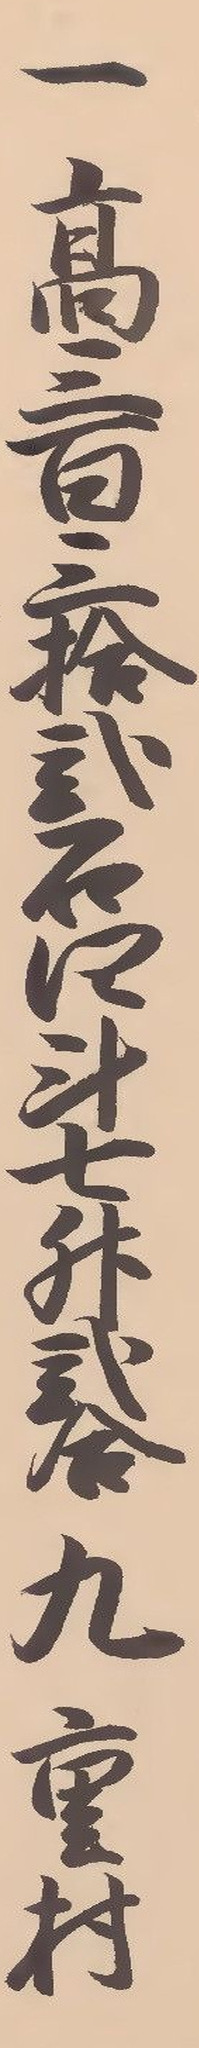一高三百三拾弐石四斗七升弐合九重村
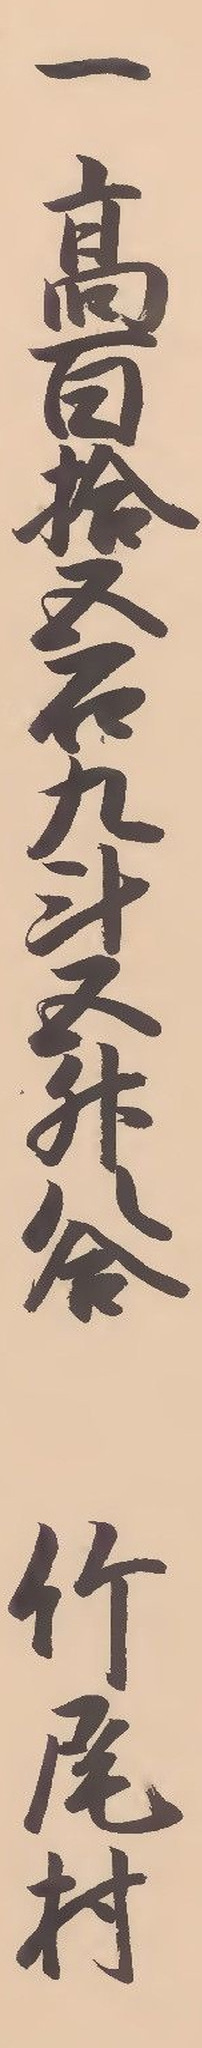一高百拾五石九斗五升八合竹尾村

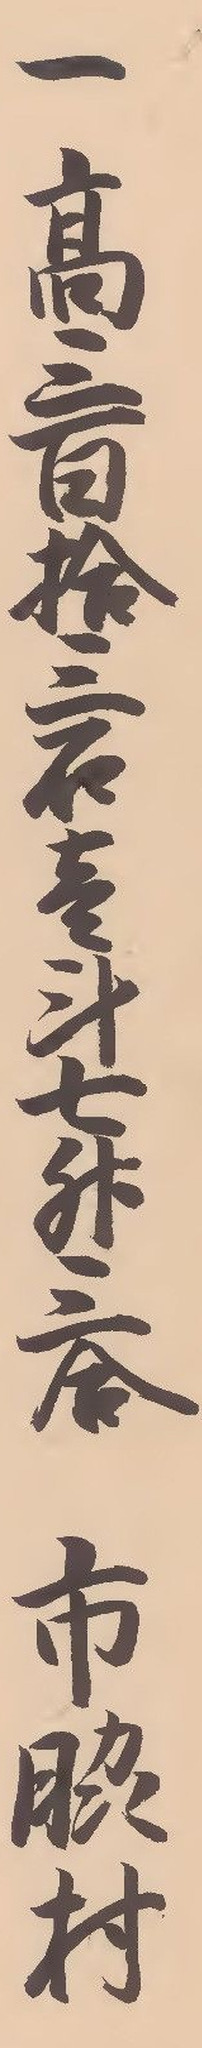一高三百拾三石壱斗七升三合市脇村
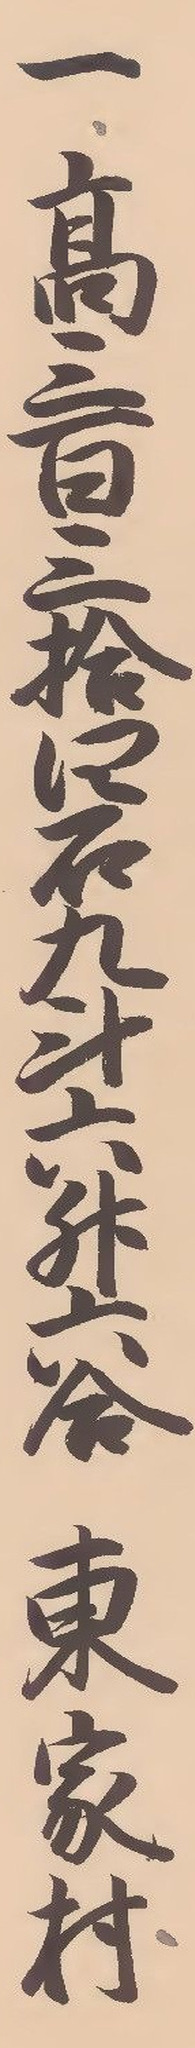一高三百三拾四石九斗六升六合東家村
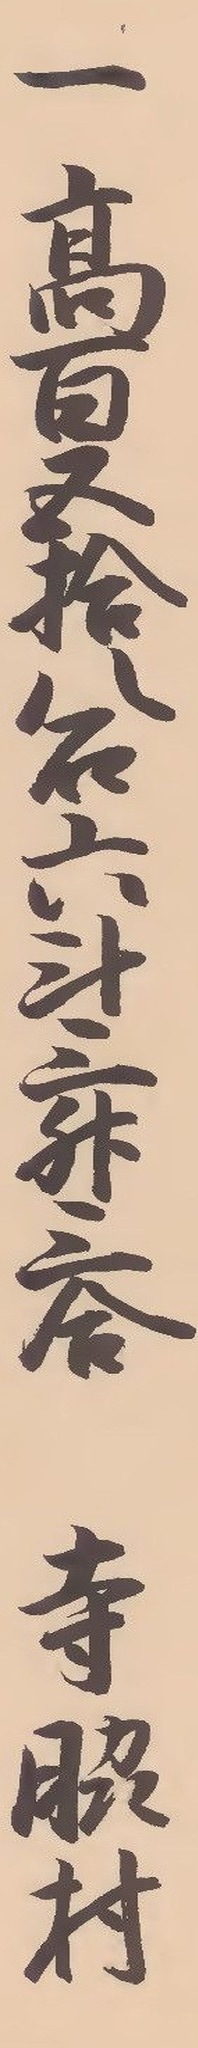一高百五拾八石六斗三升三合寺脇村
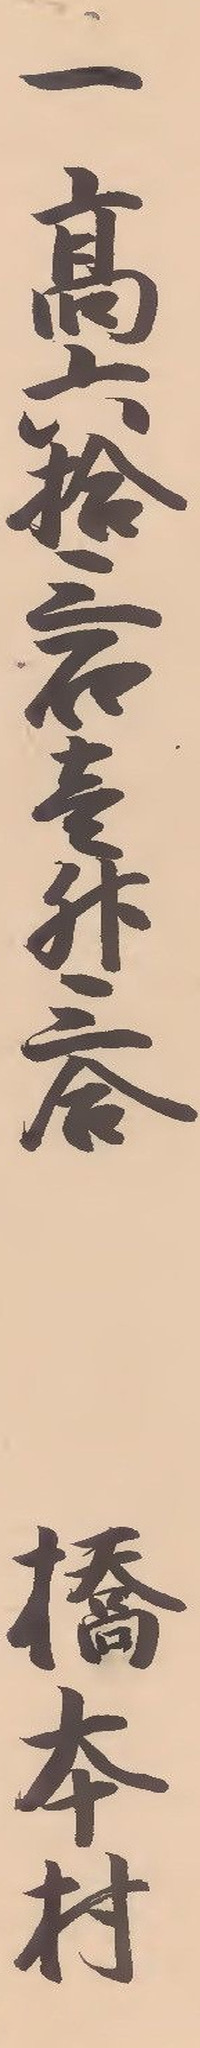一高六拾三石壱升三合橋本村
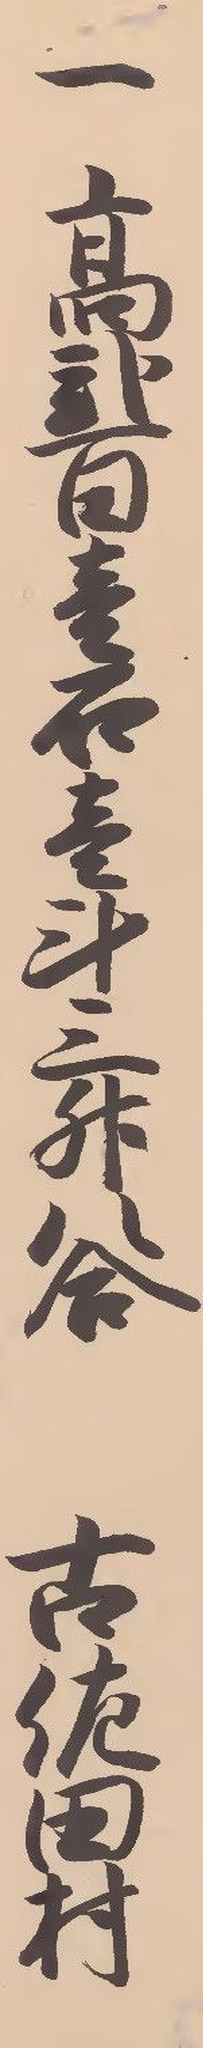一高弐百壱石壱斗三升八合古佐田村
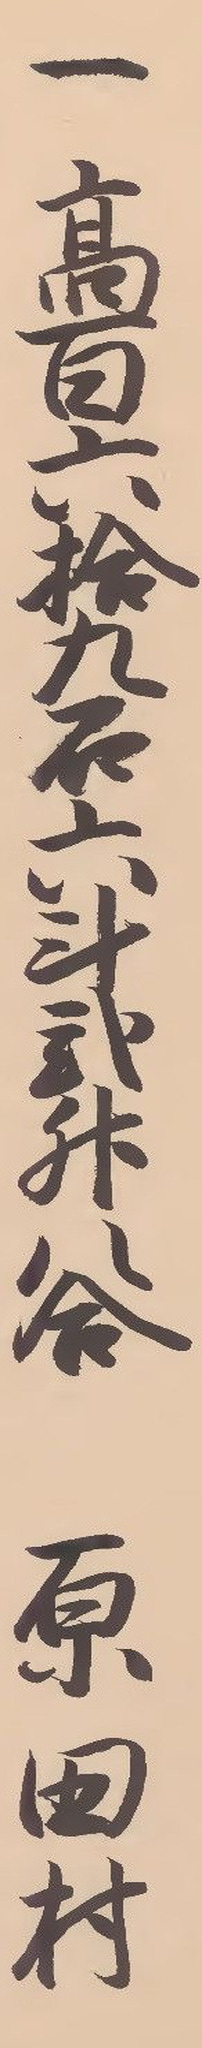一高百六拾九石六斗弐升八合原田村
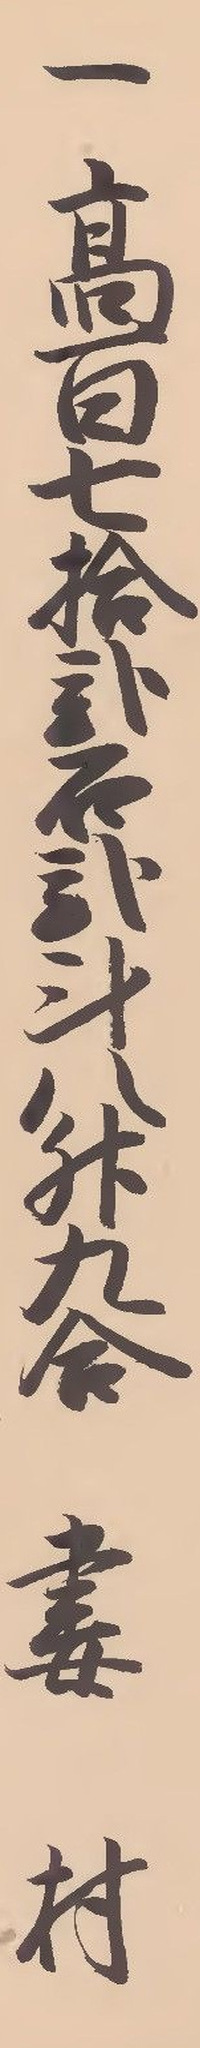一高百七拾弐石弐斗八升九合妻村
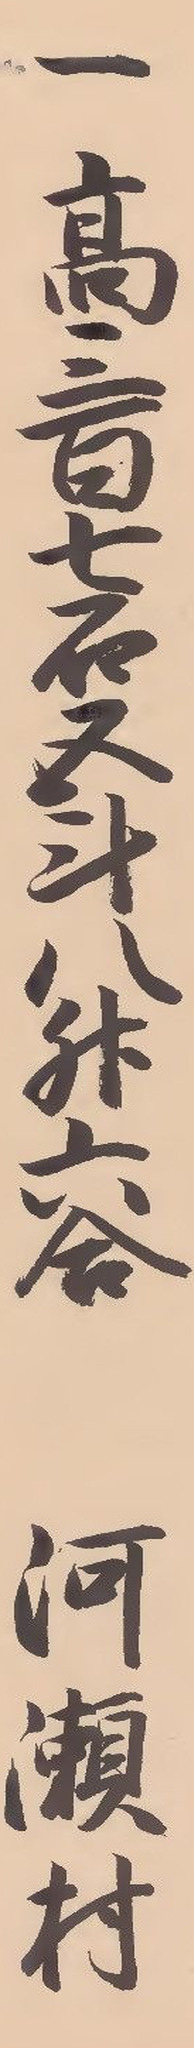一高三百七石五斗八升六合河瀬村
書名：紀伊国郷帳
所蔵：国立公文書館 National Archives of Japan
